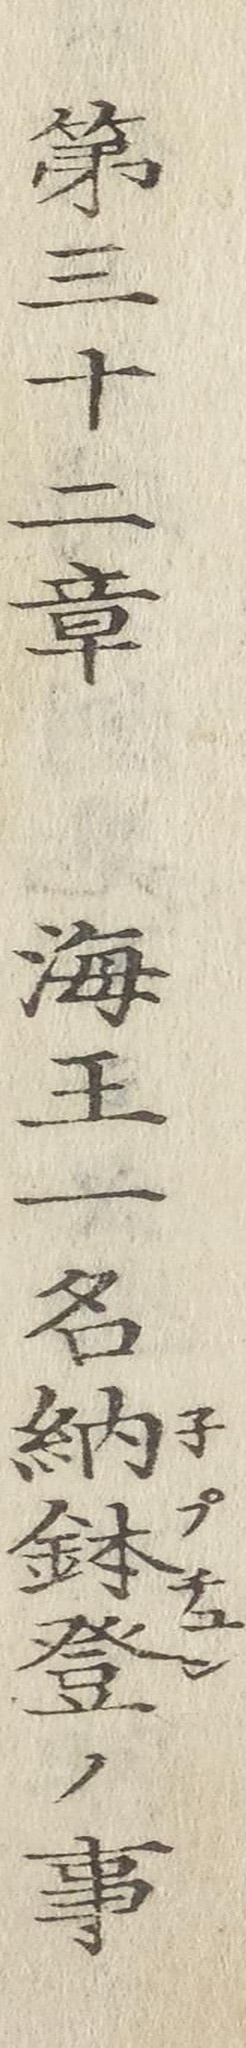第三十二章海王一名納鉢登ノ事

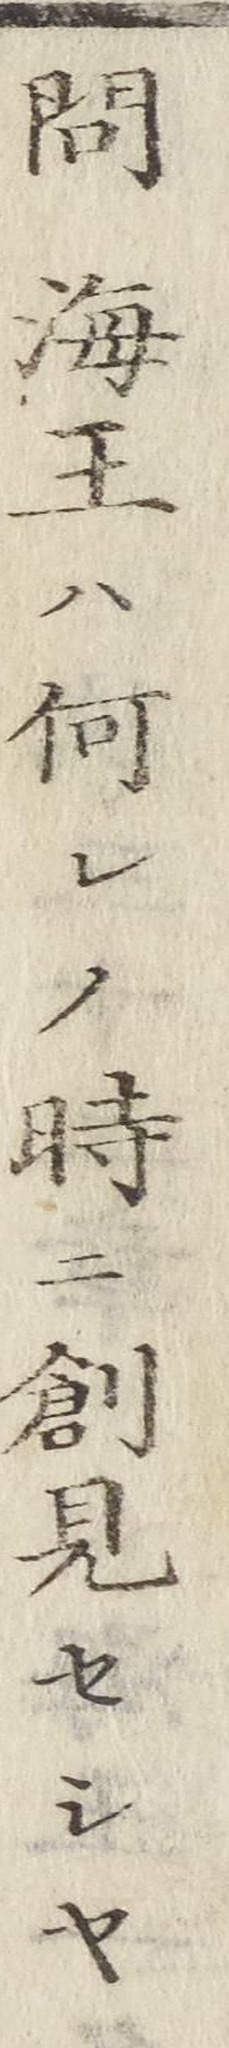問海王ハ何レノ時ニ創見セシヤ
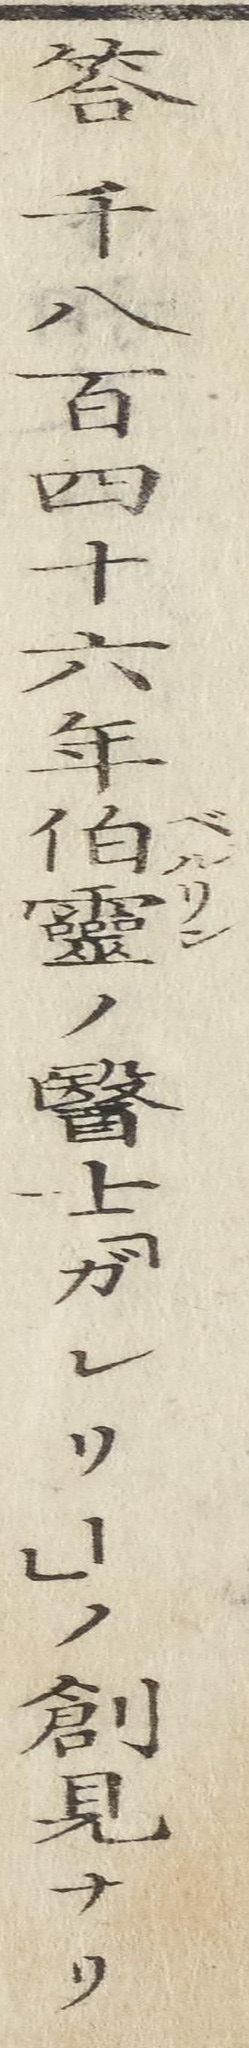答千八百四十六年伯霊ノ医士「ガレリー」ノ創見ナリ
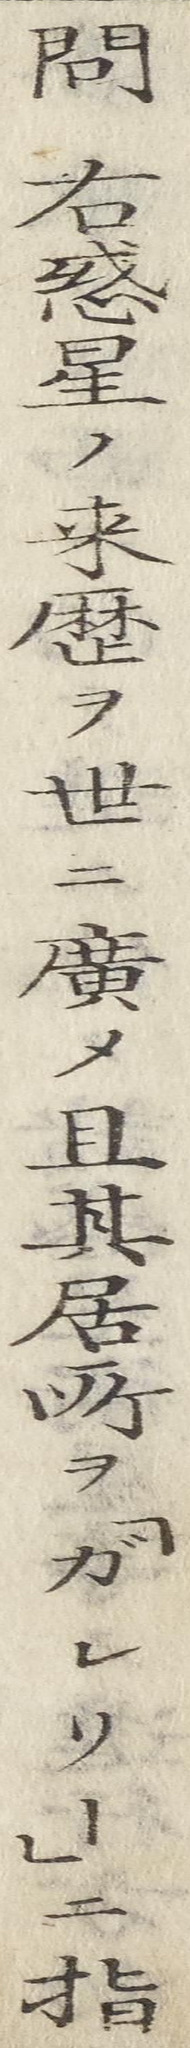問右惑星ノ来歴ヲ世ニ広メ且其居所ヲ「ガレリー」ニ指
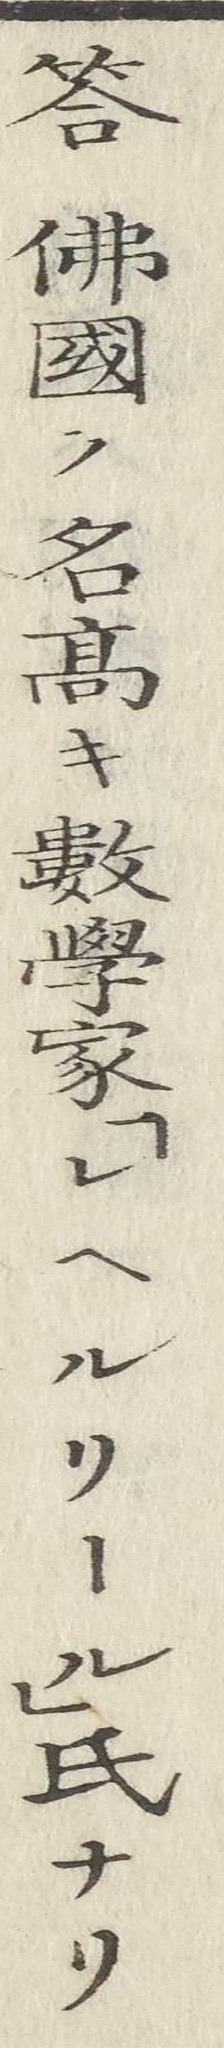答仏国ノ名高キ数学家「レヘルリール」氏ナリ
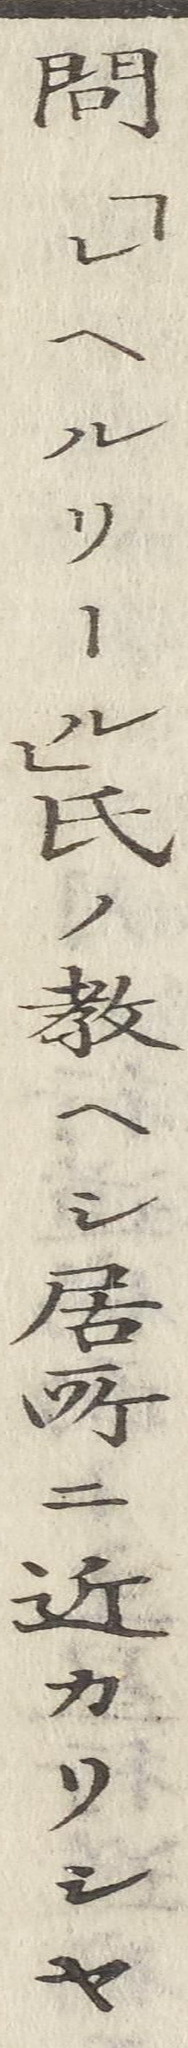問「レヘルリール」氏ノ教ヘシ居所ニ近カリシヤ
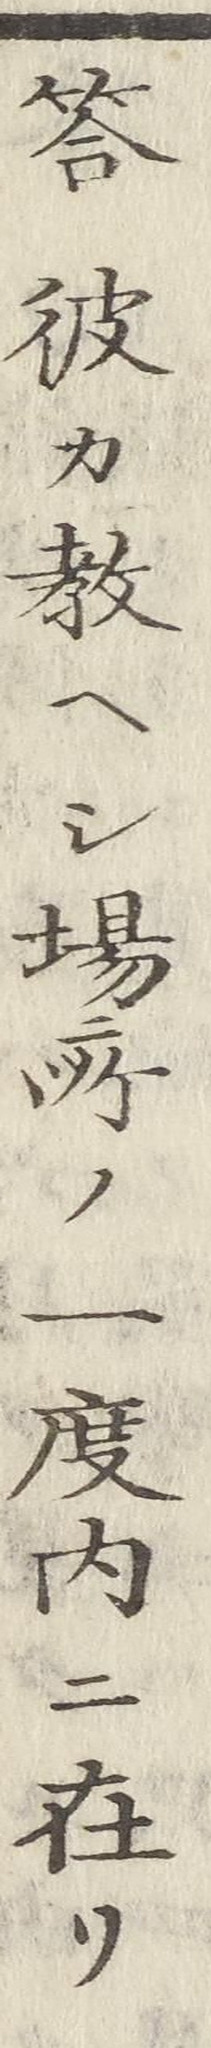答彼カ教ヘシ場所ノ一度内ニ在リ
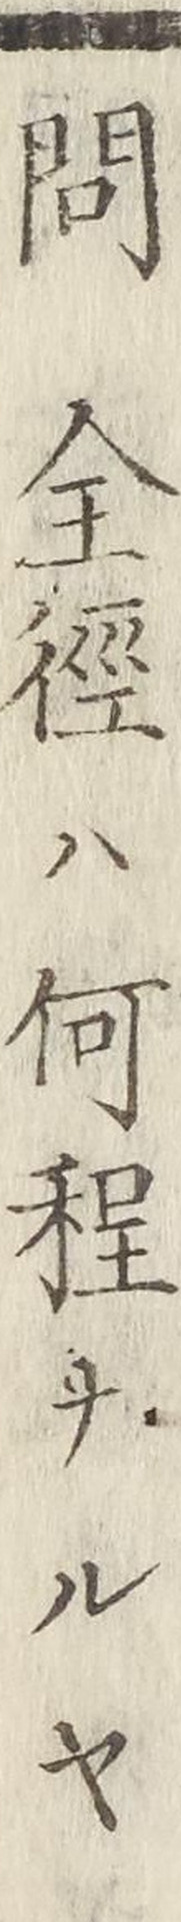問全径ハ何程ナルヤ
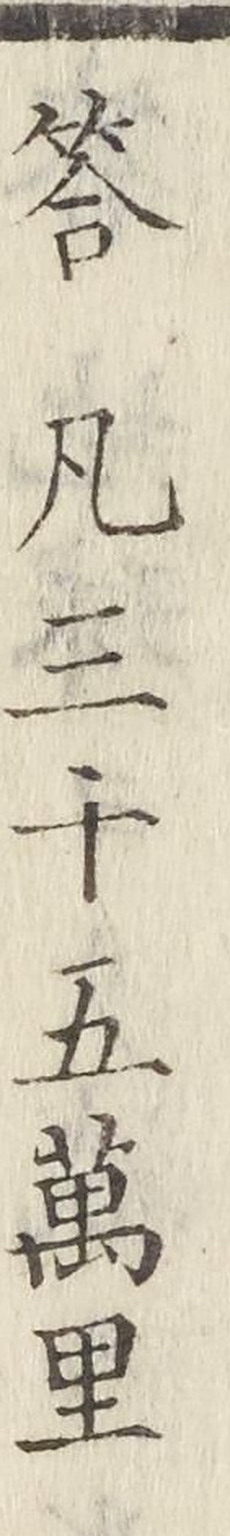答凡三十五万里
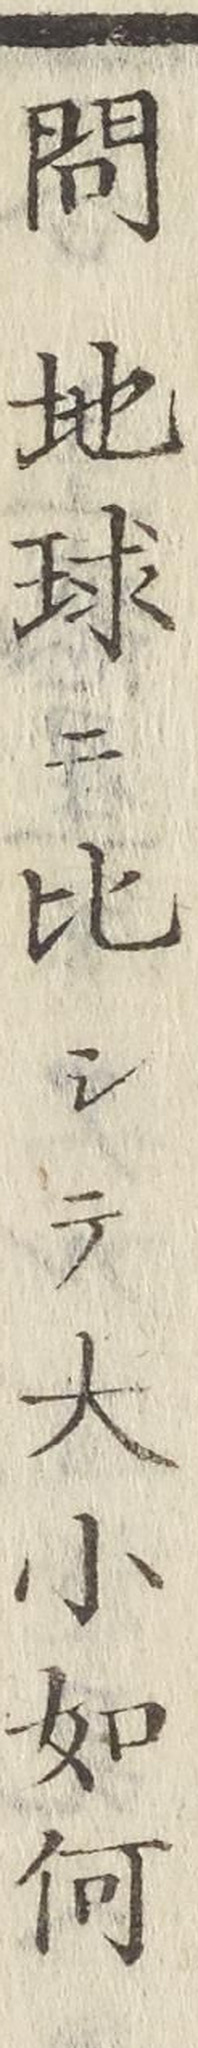問地球ニ比シテ大小如何
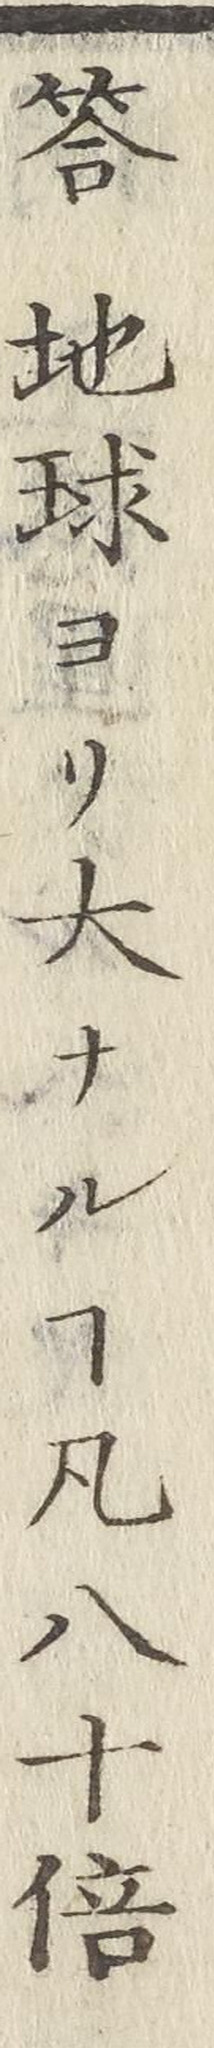答地球ヨリ大ナルコト凡八十倍
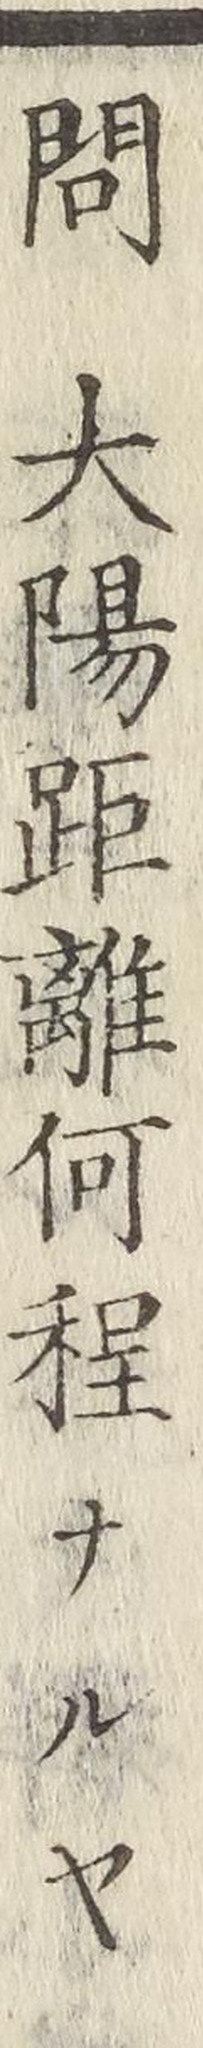問大陽距離何程ナルヤ
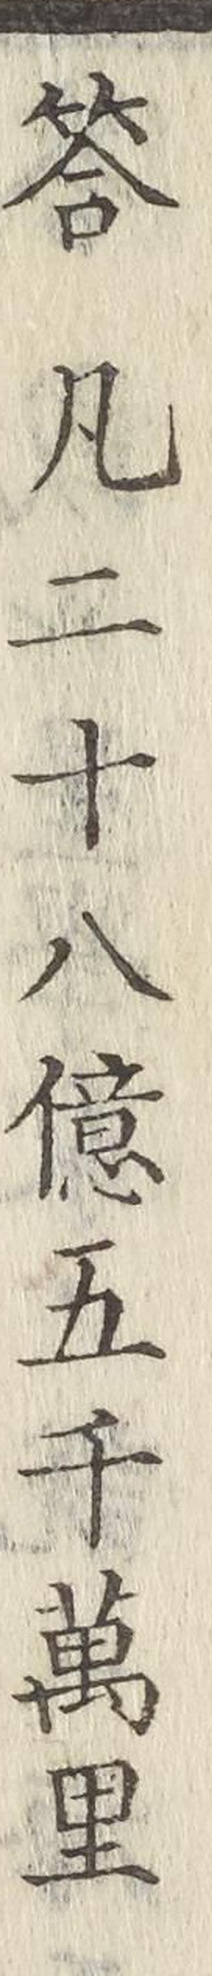答凡二十八億五千万里
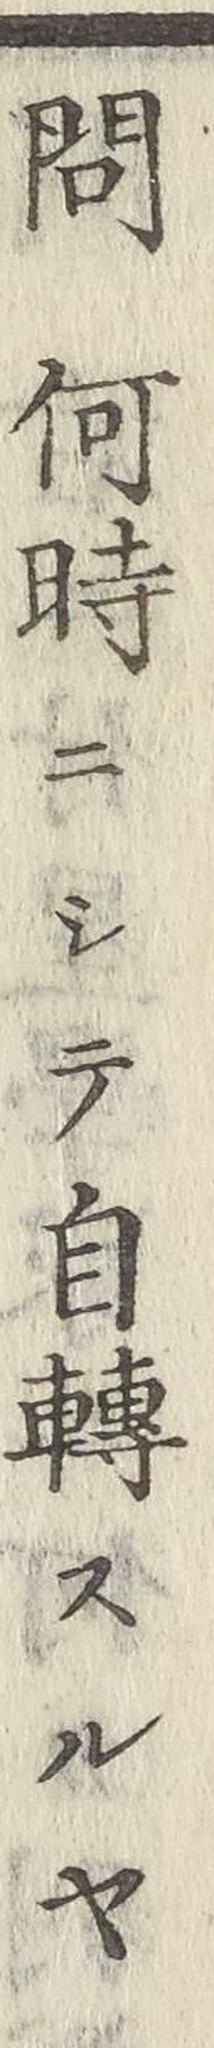問何時ニシテ自転スルヤ
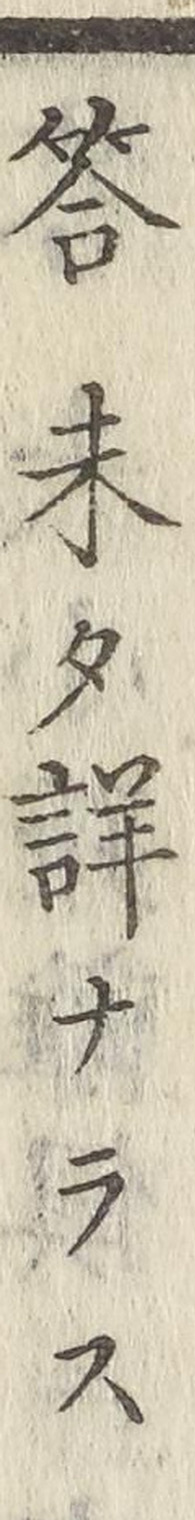答未タ詳ナラス
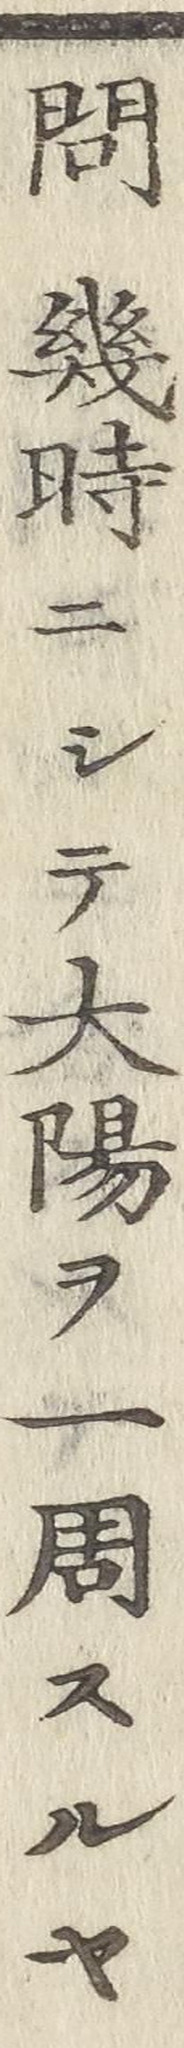問幾時ニシテ大陽ヲ一周スルヤ
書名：星学圖説　下
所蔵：東京大学地震研究所図書室 Earthquake Research Institute Library, The University of Tokyo, JAPAN
